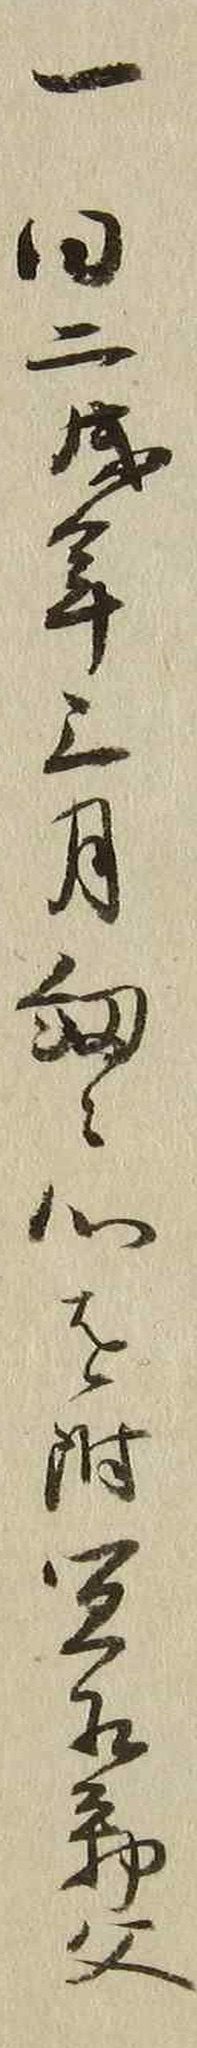一同二戌年三月細々心を附宜相勤父
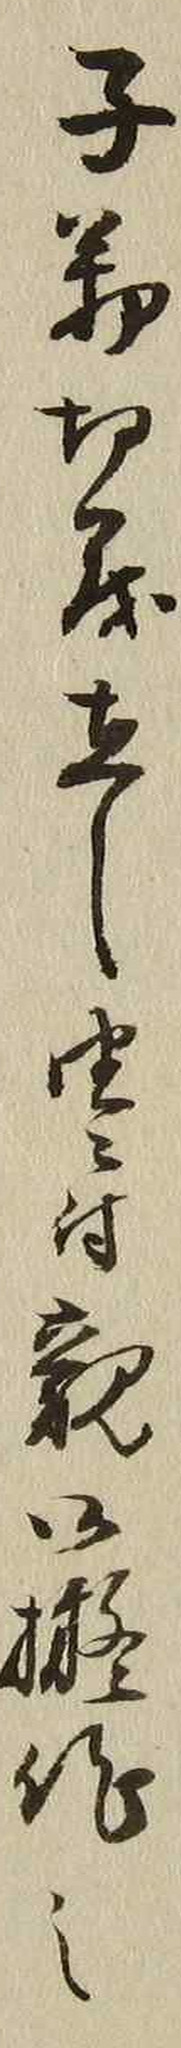子勤切義在之由ニ付親御擬作之
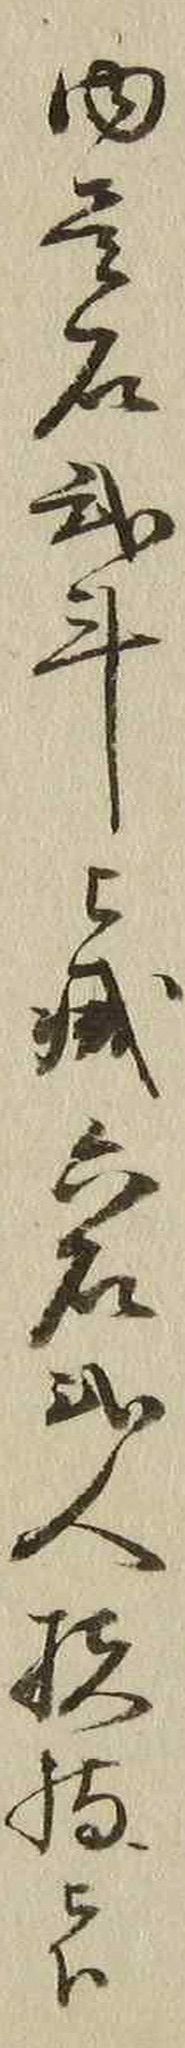内壱石弐斗被減六石弐人扶持被下
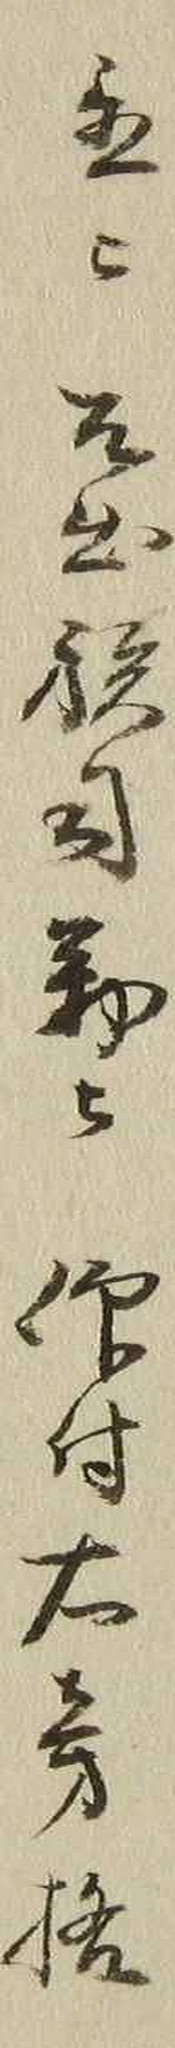置被召出族司勤被仰付右旁格
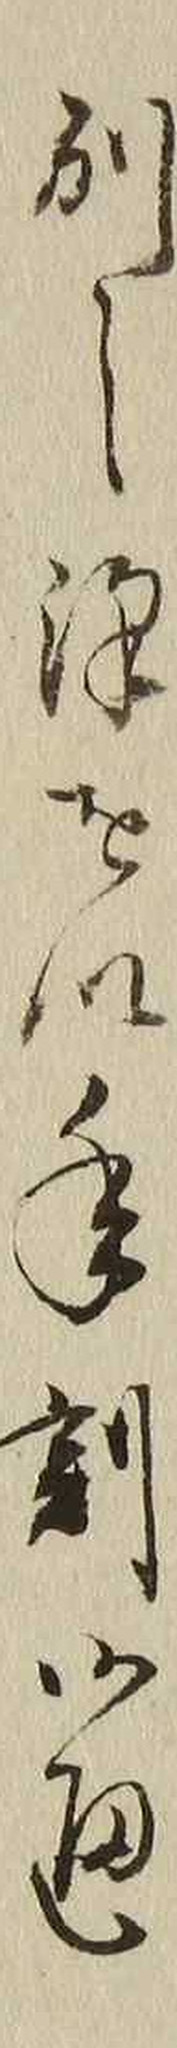別之訳を以年割御通
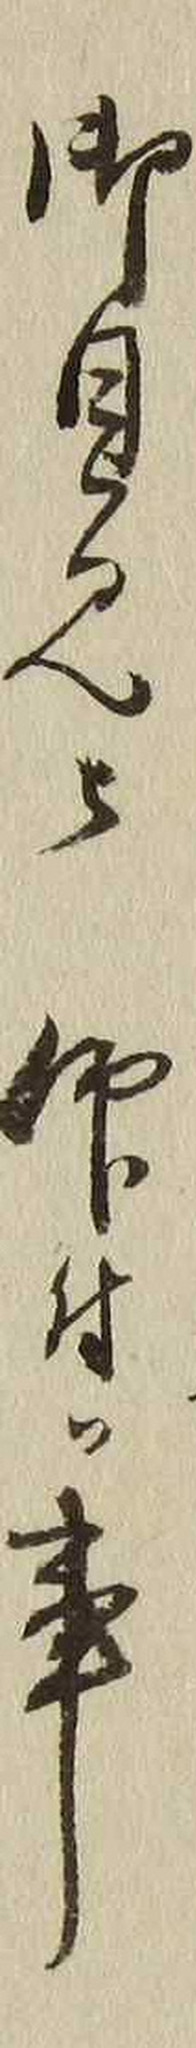御目見被仰付候事
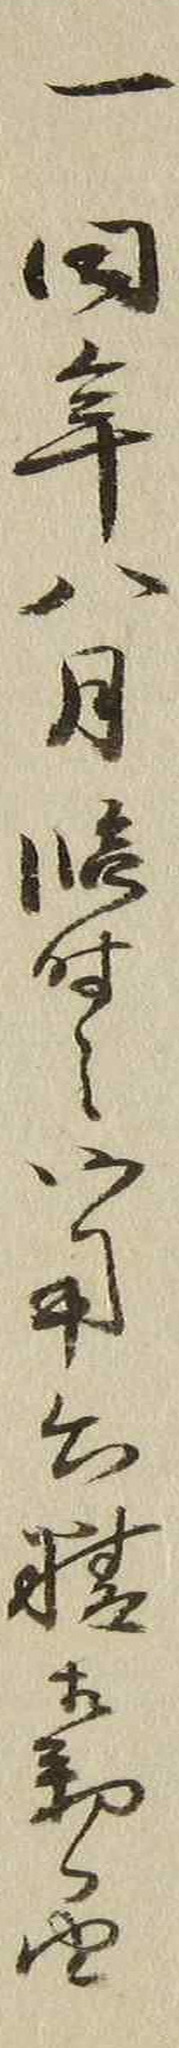一同年八月臨時之御用出精相勤候由
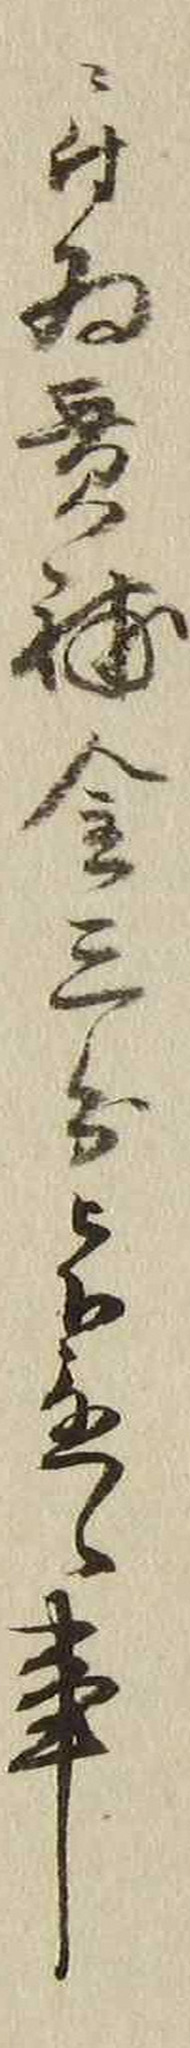ニ付為費補金三分被下置候事
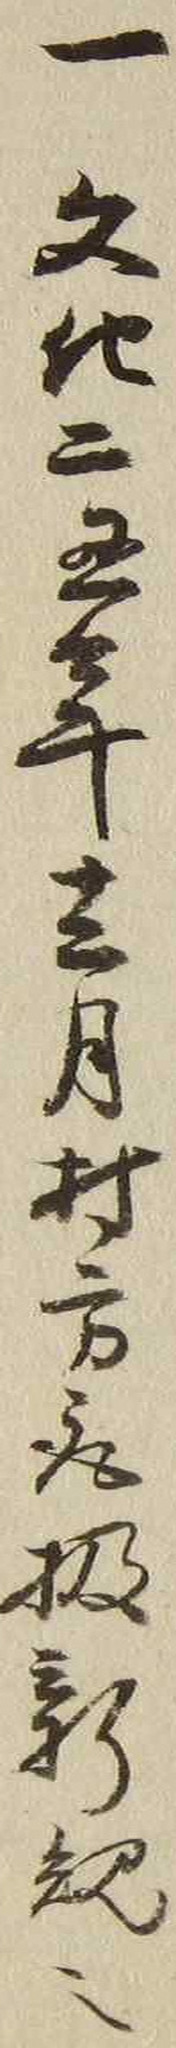一文化二丑年十二月村方取扱新規之
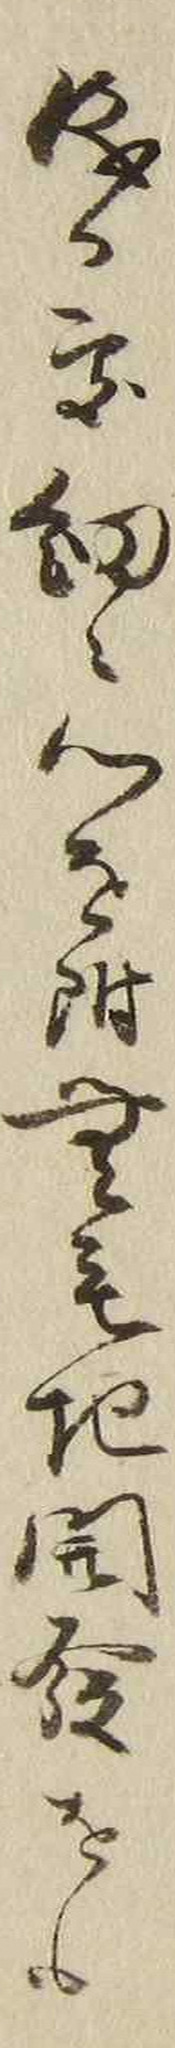儀候処細々心を附無毛地開発をも
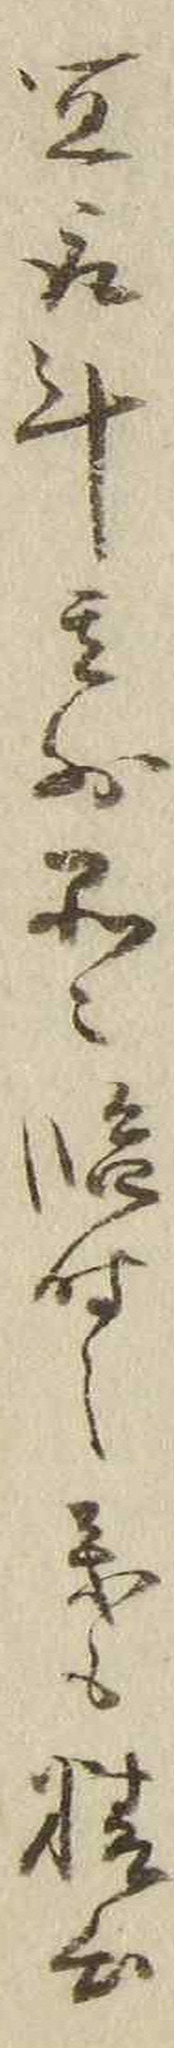宜取計其外品々臨時之義も精出

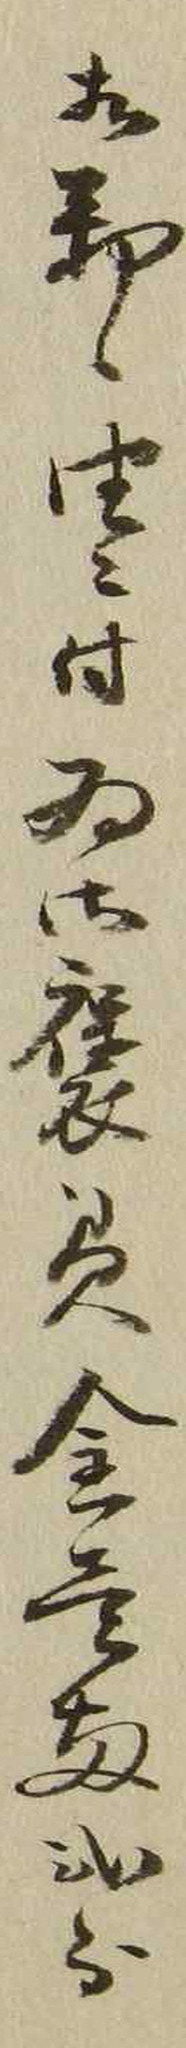相勤候由ニ付為御褒美金壱両弐分
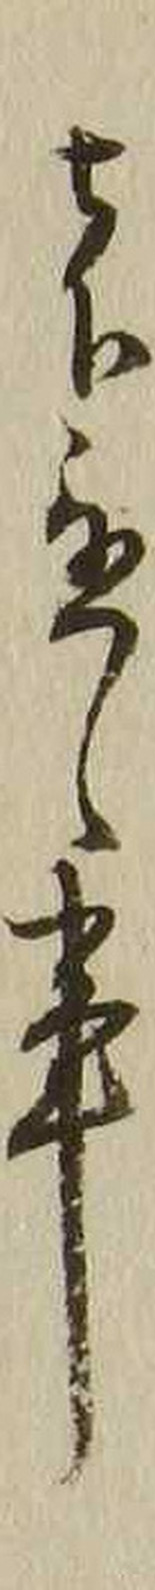被下置候事
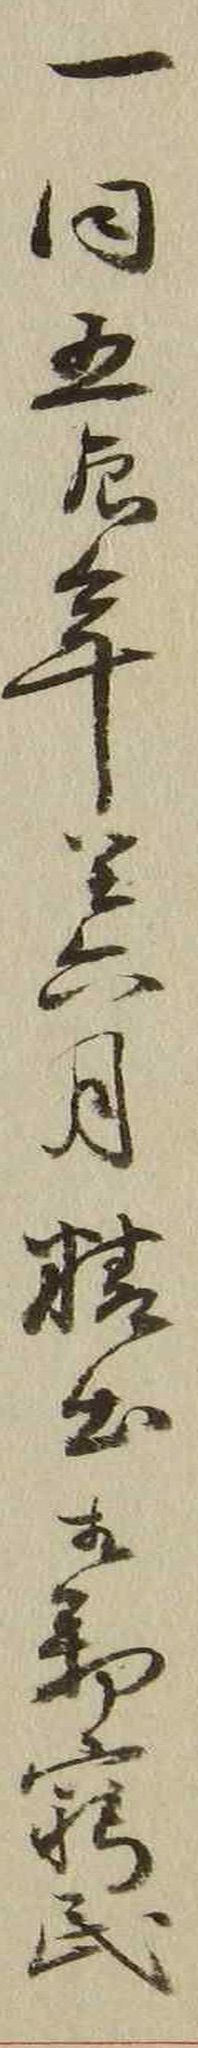一同五辰年閏六月精出相勤窮民
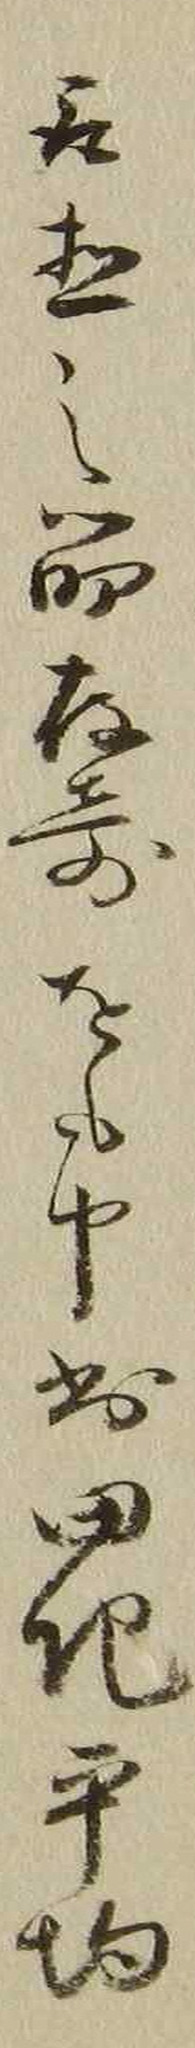取直之節存寄をも申出田地平均
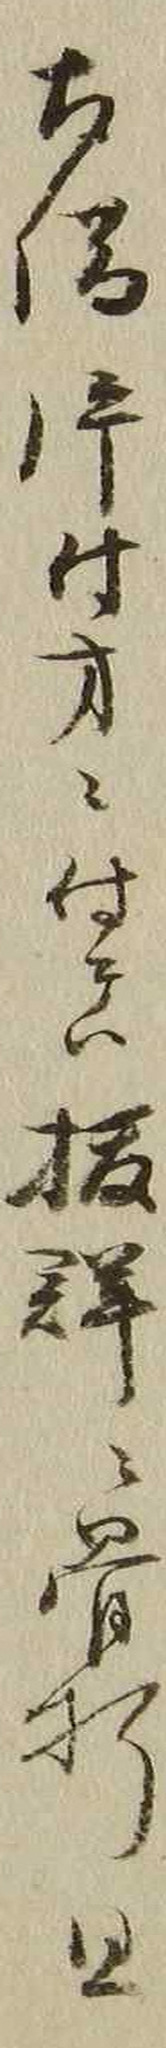拝借片付方ニ付テハ抜群ニ骨折且
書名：諸士系譜　巻之236　ふ之部4
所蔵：会津若松市立会津図書館
